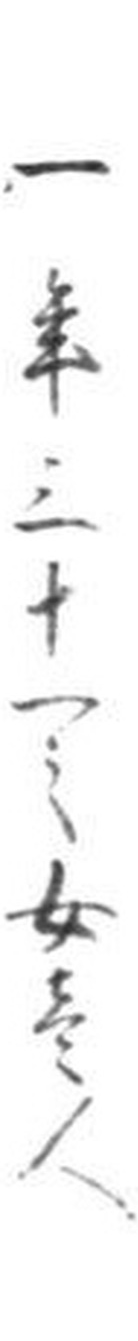一年三十一之女壱人
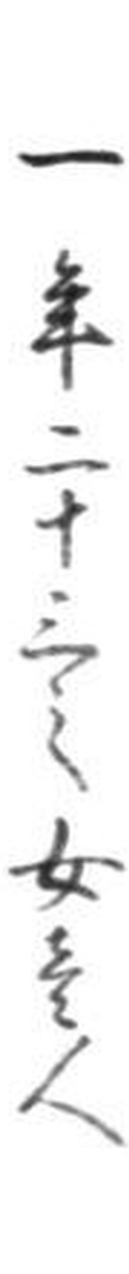一年二十三之女壱人
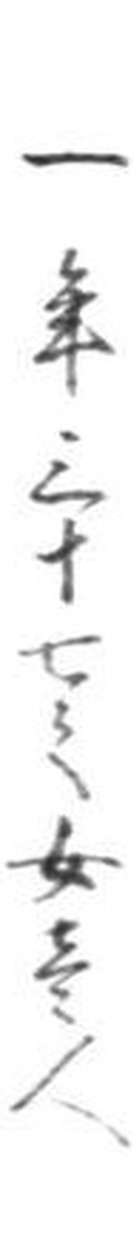一年三十七之女壱人
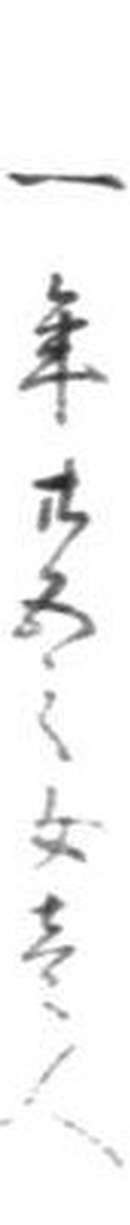一年廿五之女壱人
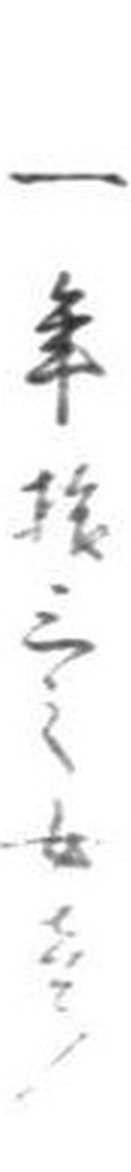一年拾三之女壱人
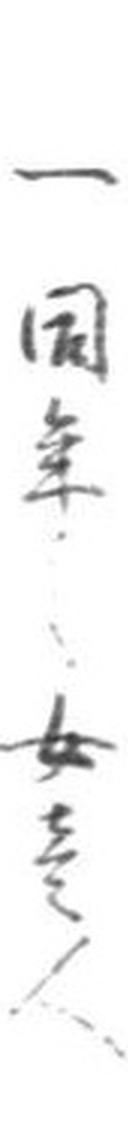一同年之女壱人
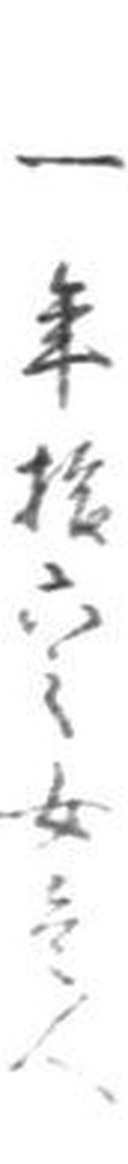一年拾六之女壱人
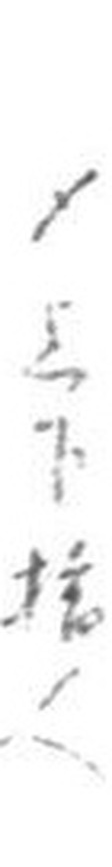〆上下拾人
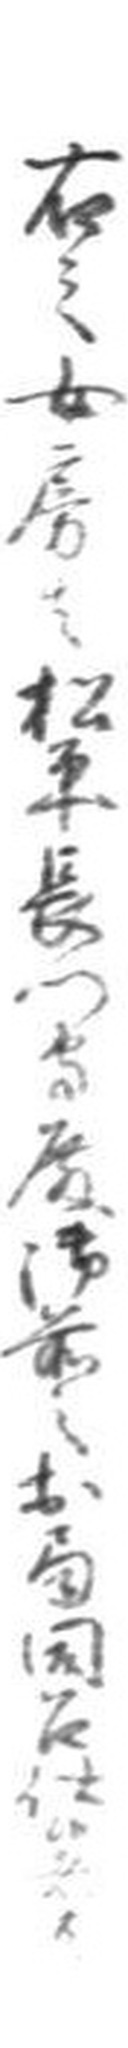右之女房は松平長門守殿御前之お局同召仕候者共

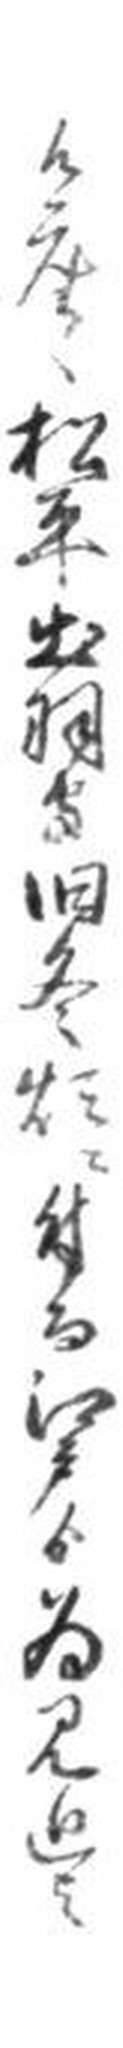御座候松平出羽守旧冬煩ニ付而江戸ゟ為見廻と
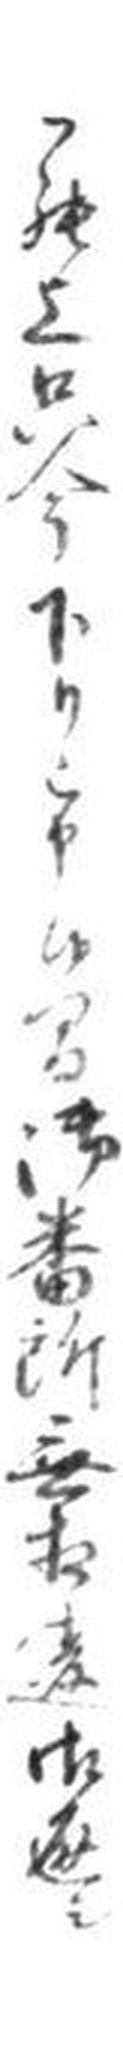罷上只今下リ被申候間御番所無相違御通シ
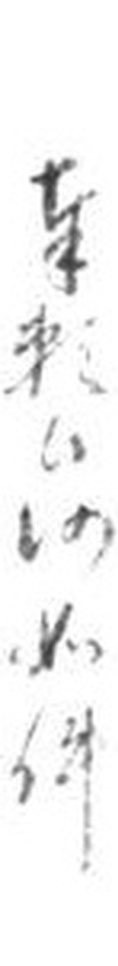奉頼候仍如件
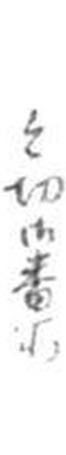今切御番所
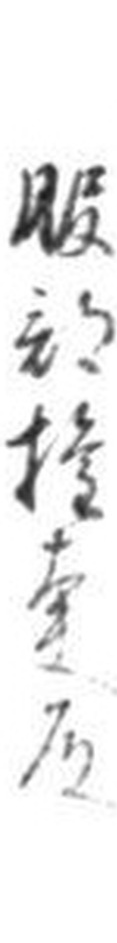服部権太夫殿
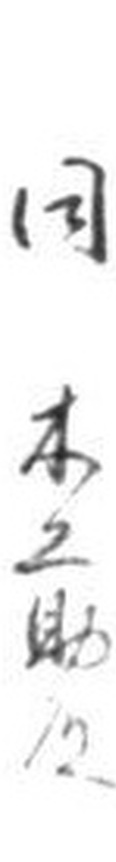同木工助殿
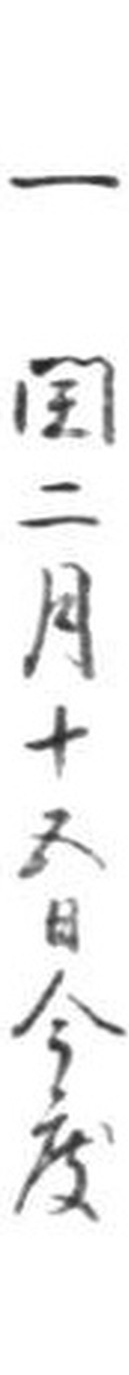一閏二月十五日今度
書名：家譜 三 忠昌公 従慶長八年到寛永六年
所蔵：福井県文書館 Fukui Prefectural Archives
